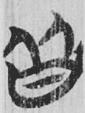皆
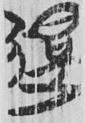逗
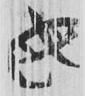母（毋）
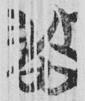敢
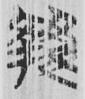執（執）
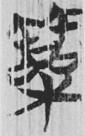○（藻）
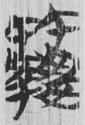○（箑）
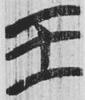王
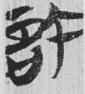許
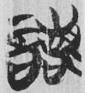諾
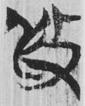攸（修）
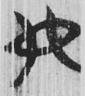四
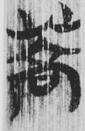蒿（郊）
